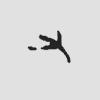又
